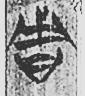周
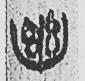幽
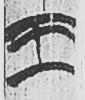王
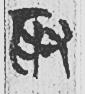取
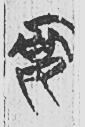妻
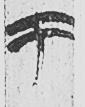于
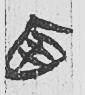西
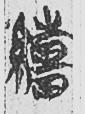{糸東田}
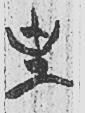生
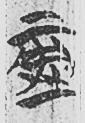坪
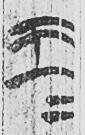王=
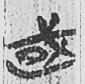或
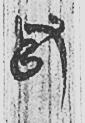{𡴎又}
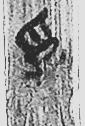孚
